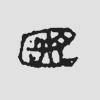匿
